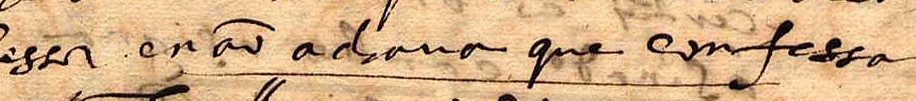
fessor e não achaua que confessar
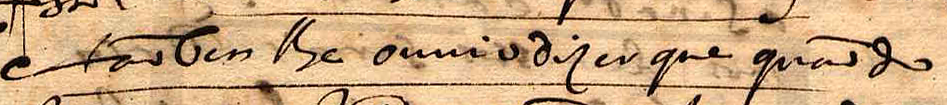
e tãobem lhe ouuio dizer que quãodo
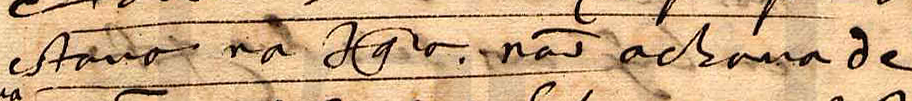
estaua na Iḡra não achaua de
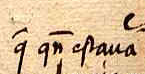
q̄ qn̄ estaua
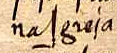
na Jgreja
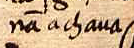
nā achaua
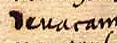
deuoçam
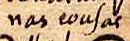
nas cousas
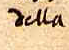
della
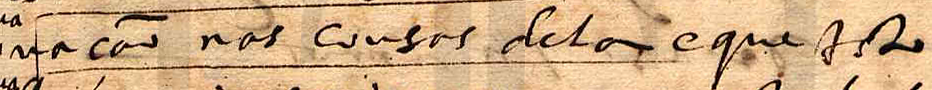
uoçaõ nas cousas dela e que Isto
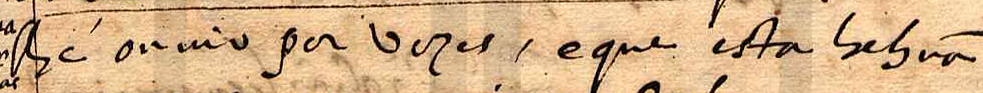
lhe ouuio por vezes / e que esta he huā
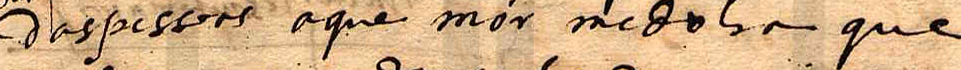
das pessoas a que mor medo ha que
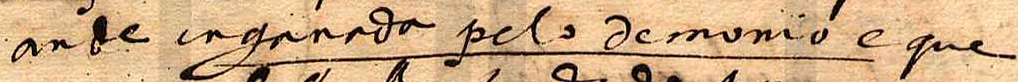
ande enganada pelo demonio e que
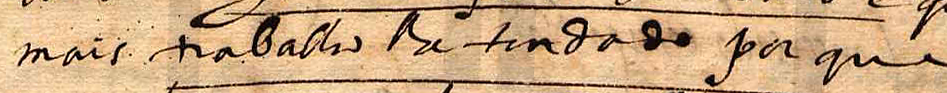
mais trabalho lhe ten dado porque
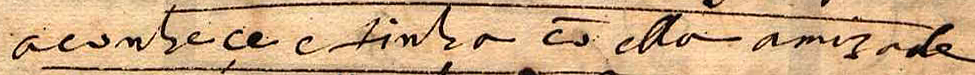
a conhece e tinha cō ella amizade
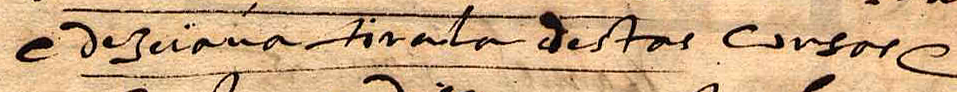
e dezeiaua tirala destas cousas e
